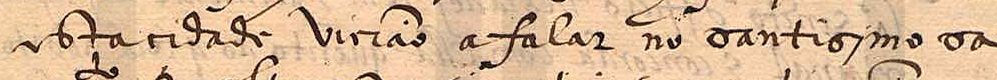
esta cidade vierão a falar no santisymo sa
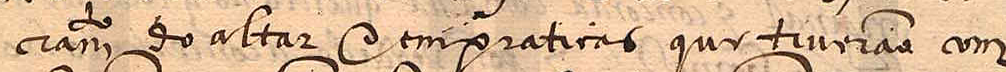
cramto do altar e em praticas que tiuerão com
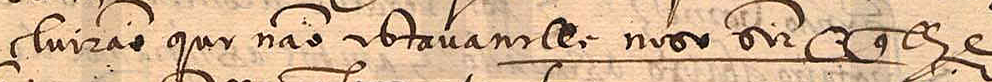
cluirão que não estaua nelle noso s̄or e q̄ lhe
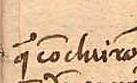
q̄ cōcluirō
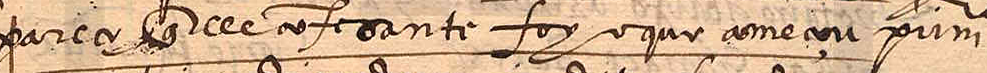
parece q̄ elle cōfesante foy o que começou primro
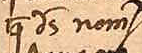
q̄ ds̄ nom
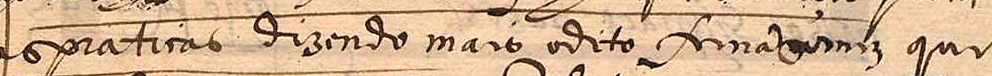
as praticas dizendo mais o dito fernā gomez que
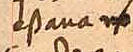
estaua no
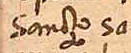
Sancto sa
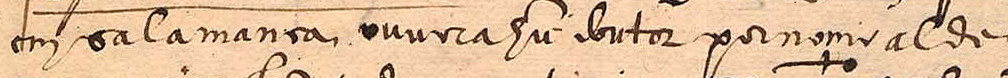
em salamanca ouuera hū doutor por nome alde
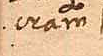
cramto
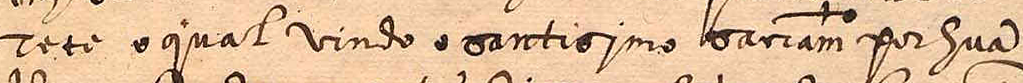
rete o qual vindo o santisymo sacramto por huā
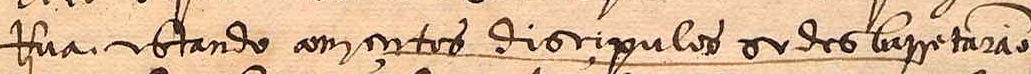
Rua estando com certos discipulos se desbarretarão
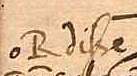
o R disse
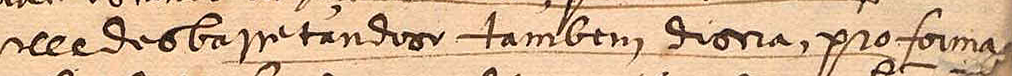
e elle desbarretandose tambem disera, pro forma
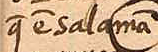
q̄ ē salamā
